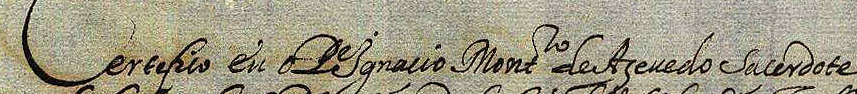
Certefico eu o Pe Ignacio Montro de Azeuedo Sacerdote
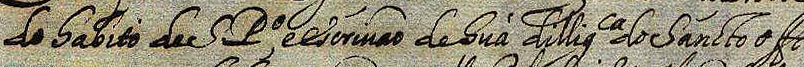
do habito de S Po, e escriuaõ de huā dilligca do Sancto offi
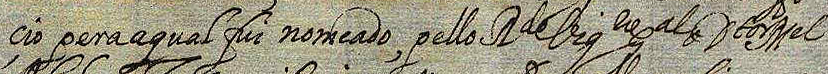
cio pera a qual fui nomeado, pello Rdo Vigro gal o Dtor Mel
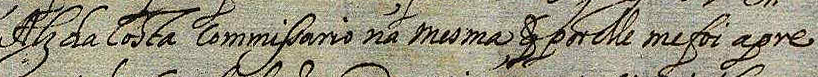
Alz̄ da Costa commissario na mesma, q̄ por elle me foi apre
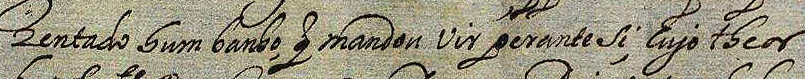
zentado hum banho, q̄ mandou vir perante si, cujo theor
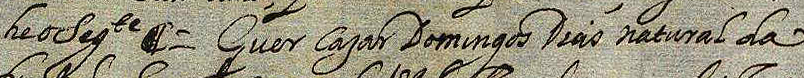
he o segte ⁋= Quer cazar Domingos Dias natural da
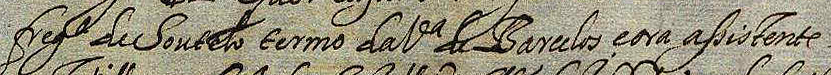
frega de Soutelo, termo da Va de Barcelos e ora assistente
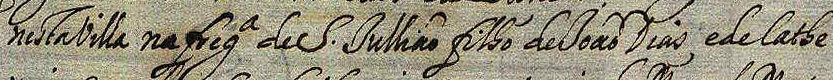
nesta Villa na frega de S. Iullião filho de Ioão Dias, e de Cathe
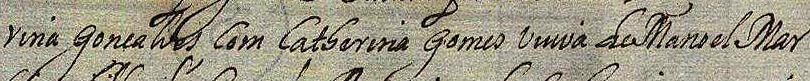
rina Gonçalves, com Catherina Gomes viuva de Manoel Mar
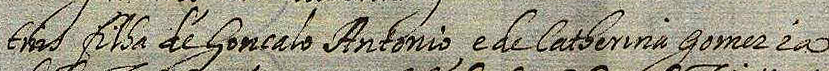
tins filha de Gonçalo Antonio, e de Catherina Gomez ia
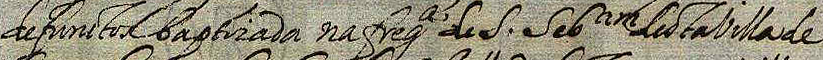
defunctos baptizada na frega de S. Sebam desta Villa de
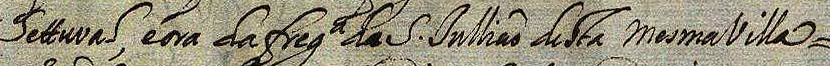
Settuval, e ora da freg.a de S. Iulliaõ desta mesma Villa
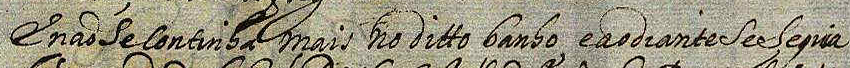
E não se continha mais no ditto banho, e ao diante se seguia
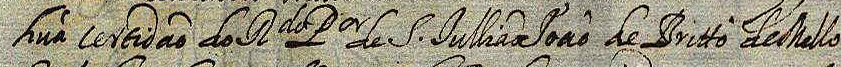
huā certidaõ do Rdo Por de S. Iulliaõ Ioaõ de Britto de Mello
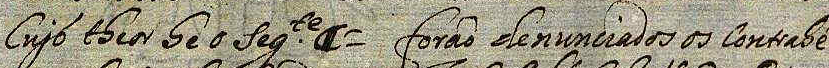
Cujo theor he o seg.te ⁋= forão denunciados os contrahē
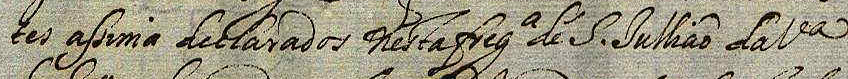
tes assima declarados nesta frega de S. Iulliaõ da Va
